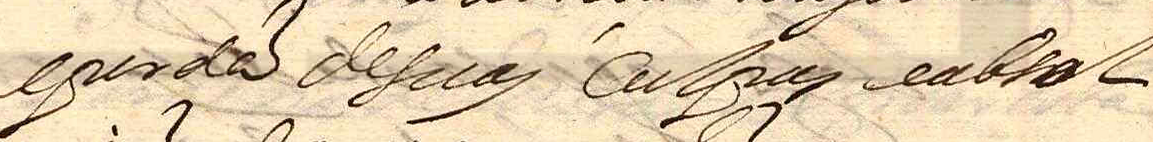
e perdaõ de suas culpas e absol
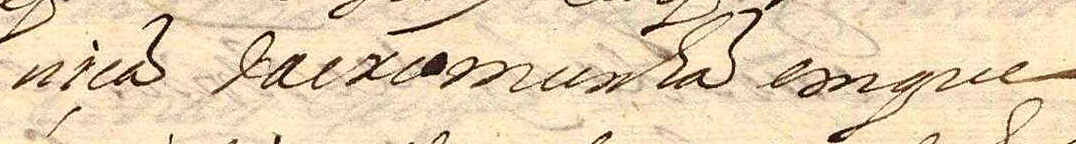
uição da excomunhão em que
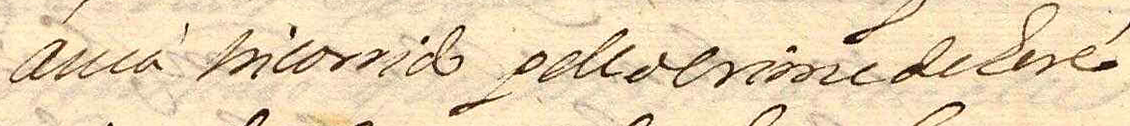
auia incorrido pello crime de here
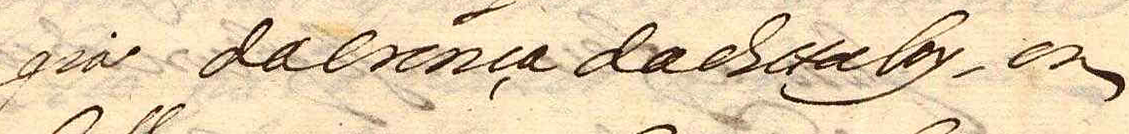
gia da crença da ditta ley, ou
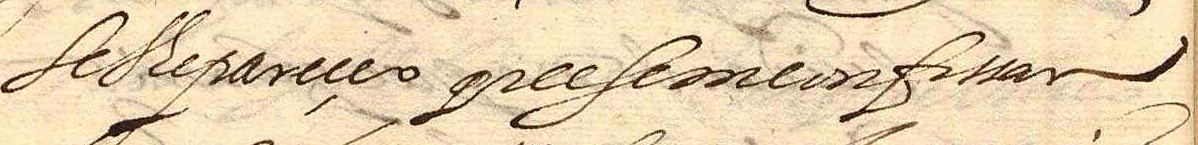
se lhe pareceo que sem confessar
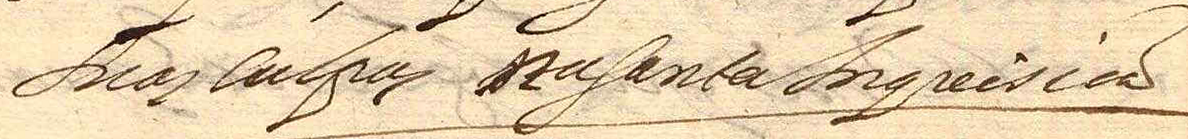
suas culpas na santa Inquisiçaõ
